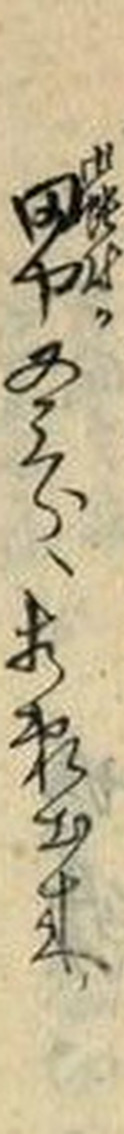田中又三郎へ相頼出来

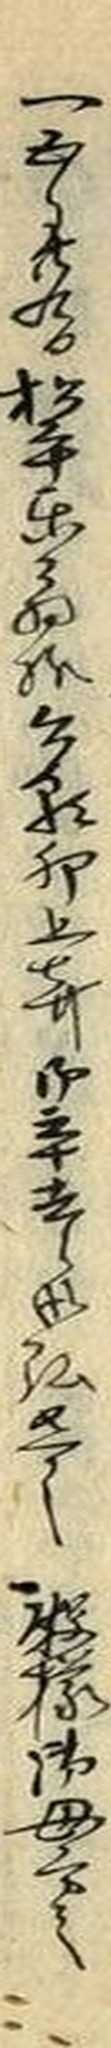一五月廿九日松平楽翁様今朝卯上刻御卒去之御弘有之殿様御母方之
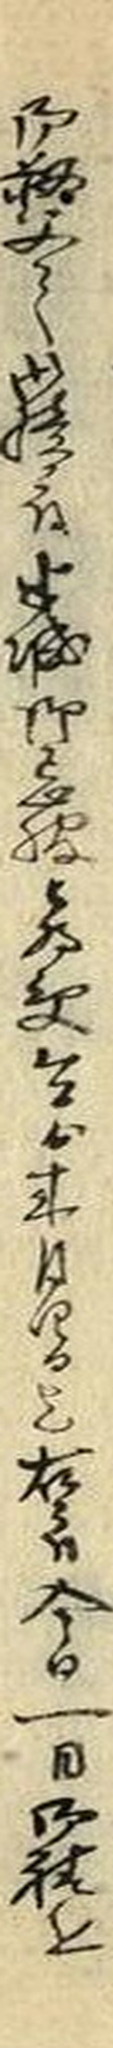御叔父之御続ニ付半減御忌服被為受今日ゟ来月四日間迄右ニ付今日一日御精進
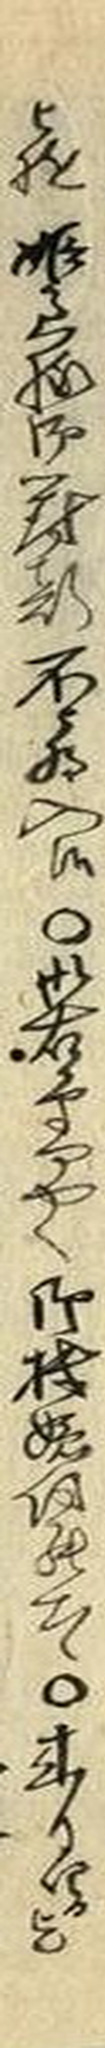被遊姫君様御対顔不被為入候○御右筆部やへ御機嫌伺罷出候○来月四日迄
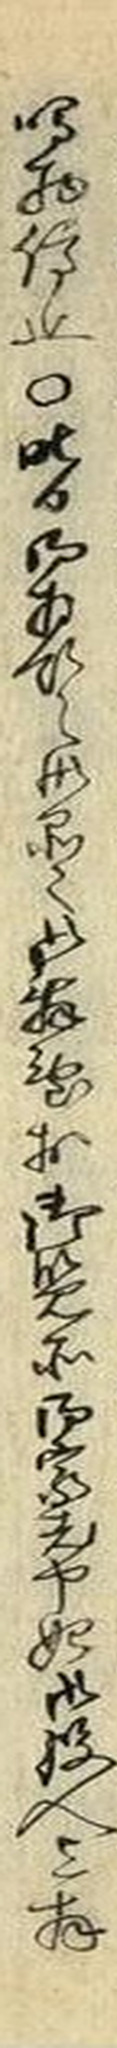鳴物停止○昨日御拝領之御品々御舞台於御覧所御家老中始御役人迄拝
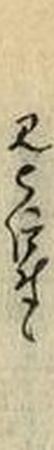見被仰付候
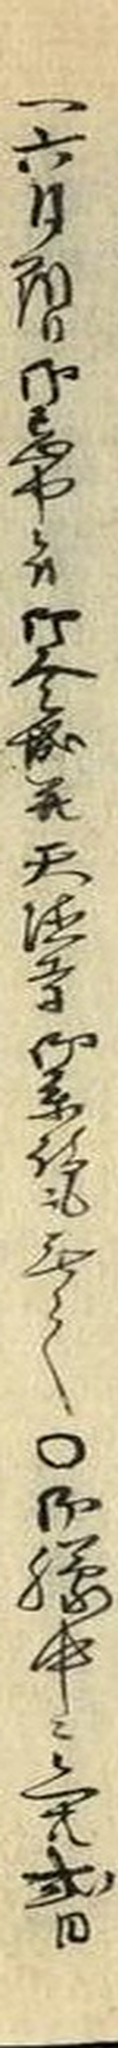一六月朔日御忌中ニ付御登城并天徳寺御参詣も無之〇御朦中ニ候へ共式日
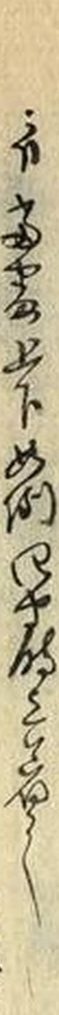ニ付当番上下如例四半時迄着之
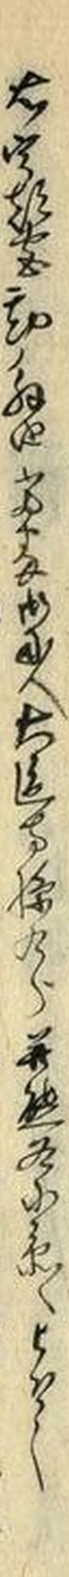右宇都宮勘解由当番御用人大道寺孫九郎并熊谷小兵衛へ被進之
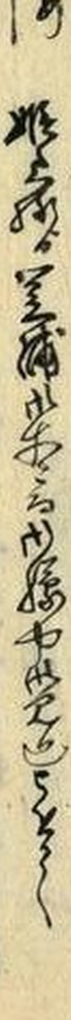姫君様ゟ切麦三重御朦中御見廻被進之
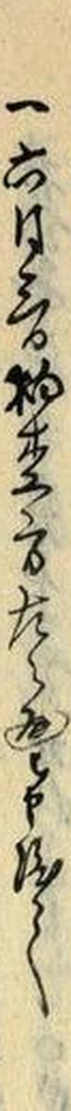一六月三日狛木工方左之通被申渡之
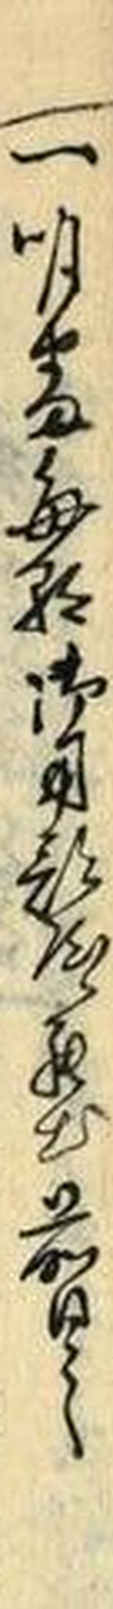一明番毎朝御用部屋罷出前日之
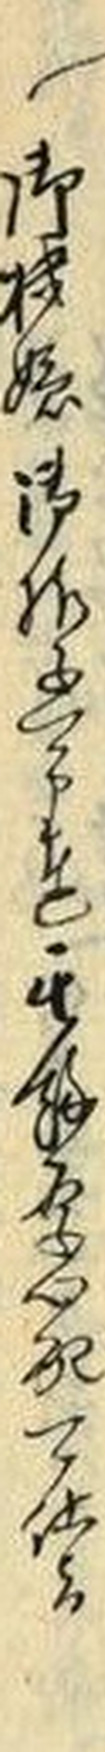御機嫌御様子可申達其餘厚心配可仕旨
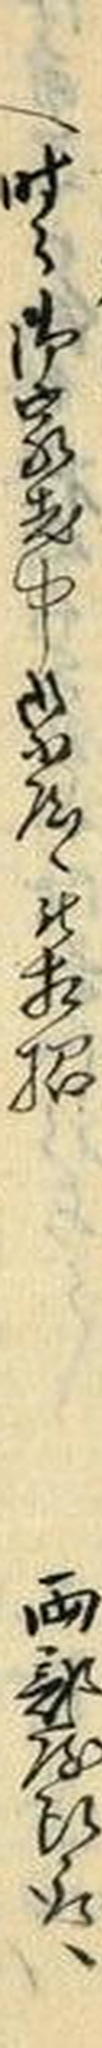時々御家老中御小屋へ被相招両部屋頭取へ
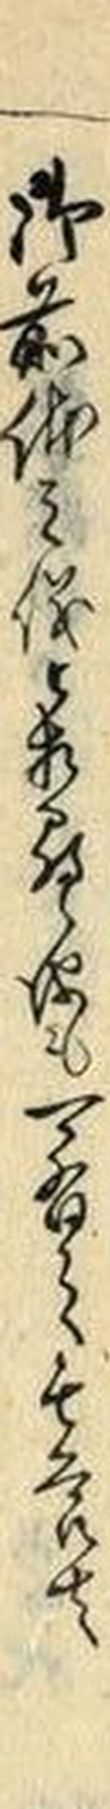御前体之儀被相尋候儀も可有之其節は
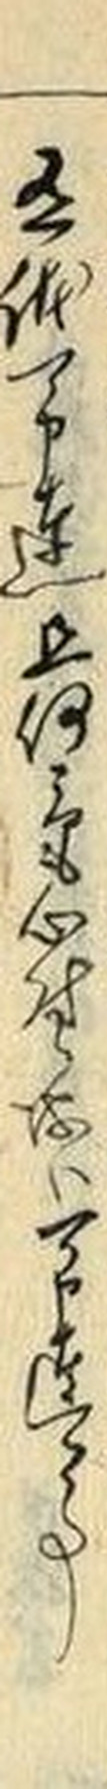有体可申達且何ニ而も心付候儀ハ可申達候事
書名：少傅日録抄（斉承付側向頭取日記、在府）
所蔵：福井県文書館 Fukui Prefectural Archives
